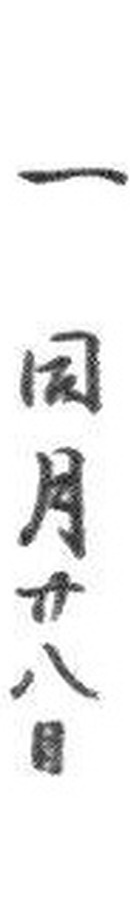一同月廿八日
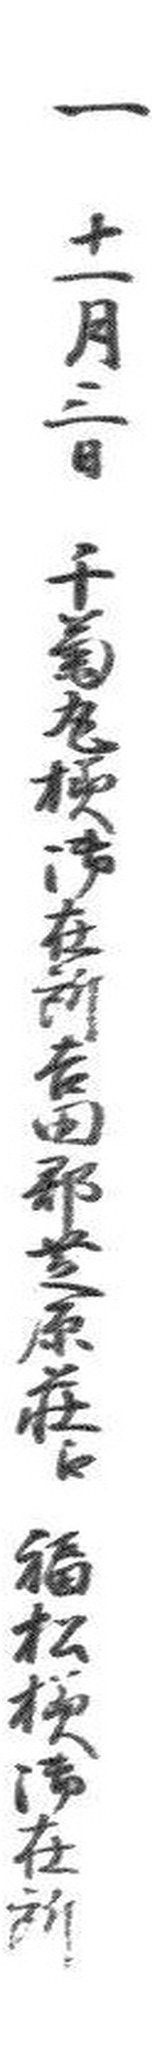一十一月三日千菊丸様御在所吉田郡芝原荘江福松様御在所
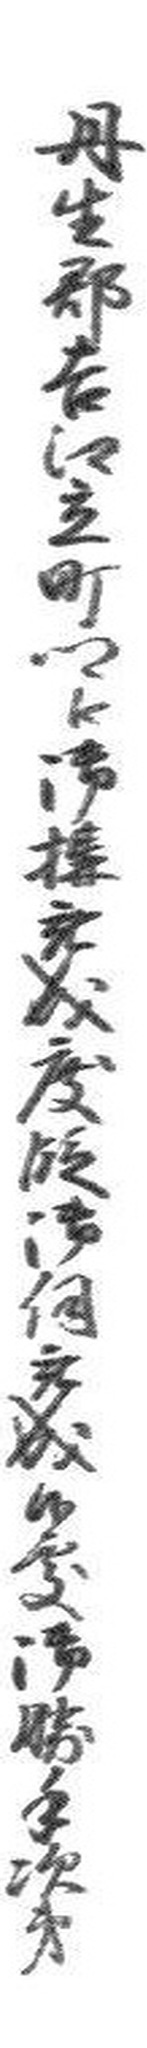丹生郡吉江立町郷江御構被成度段御伺被成候処御勝手次第
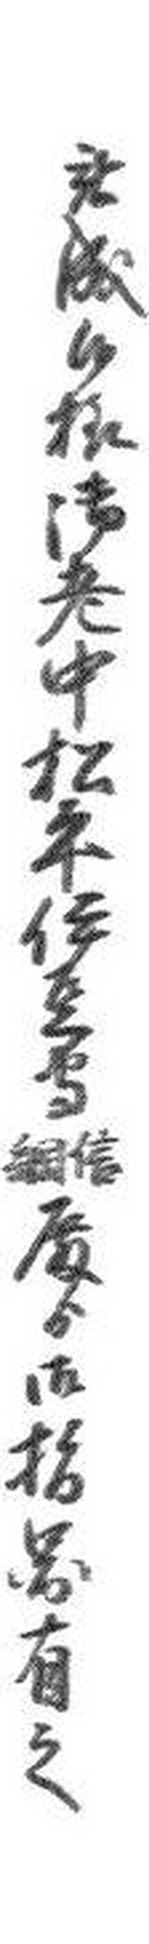被成候様御老中松平伊豆守信綱殿ゟ御指図有之
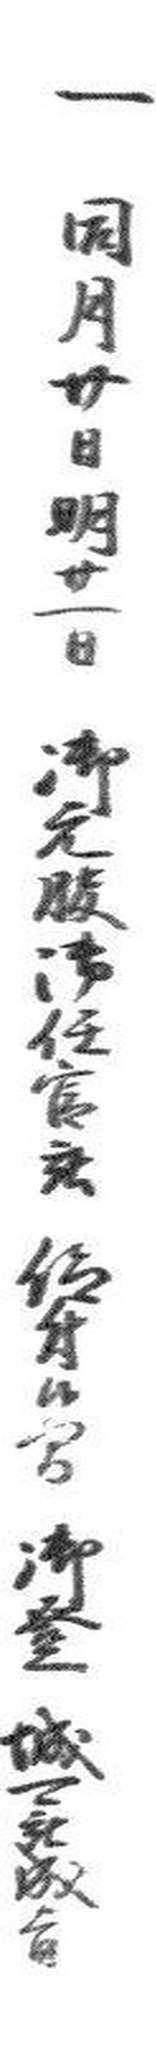一同月廿日明廿一日御元服御任官被仰付候間御登城可被成旨
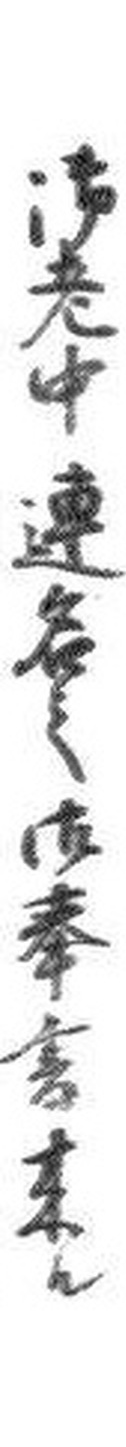御老中連名之御奉書来ル

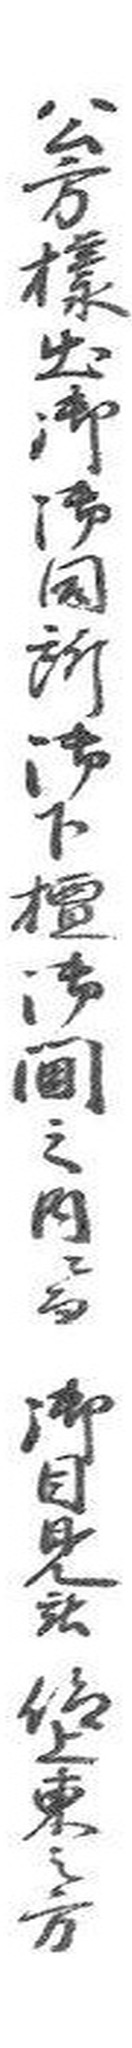公方様出御御同所御下檀御間之内ニ而御目見被仰上東之方
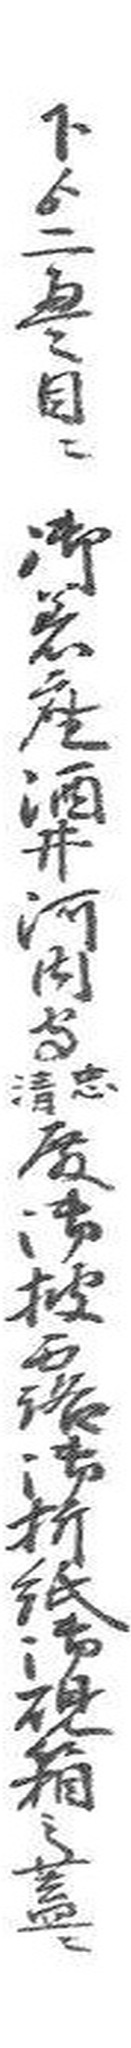下ゟ二畳目ニ御着座酒井河内守忠清殿御披露御折紙御硯箱之蓋ニ
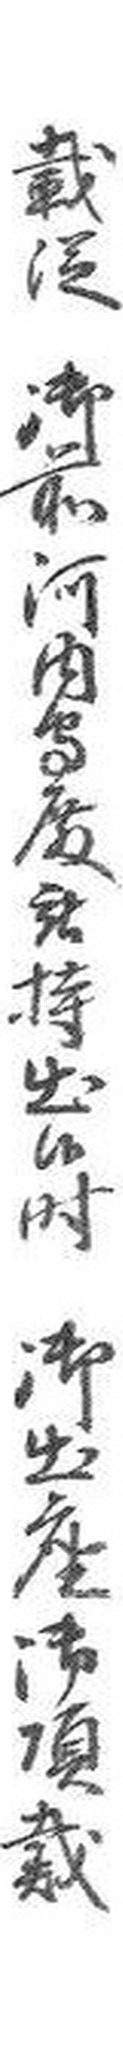載従御前河内守殿被持出候時御出座御頂戴
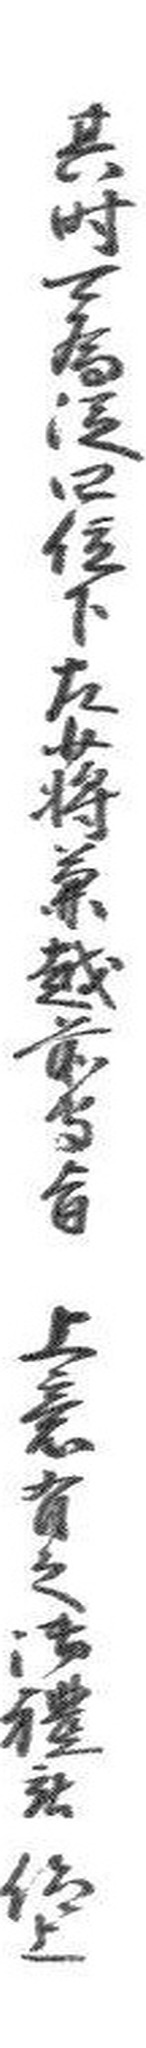其時可為従四位下左少将兼越前守旨上意有之御礼被仰上
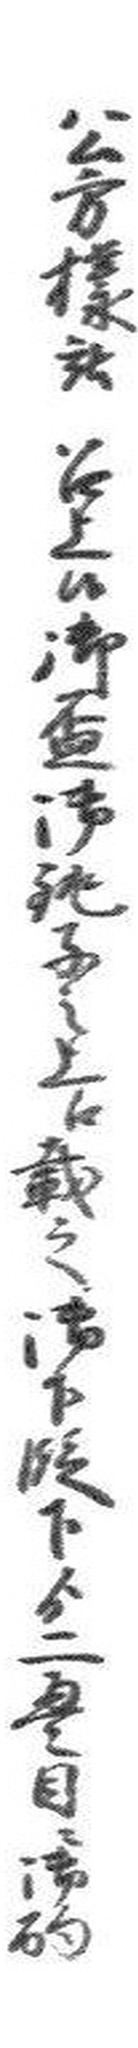公方様被召上候御盃御銚子之上江載之御下段下ゟ二畳目ニ御酌
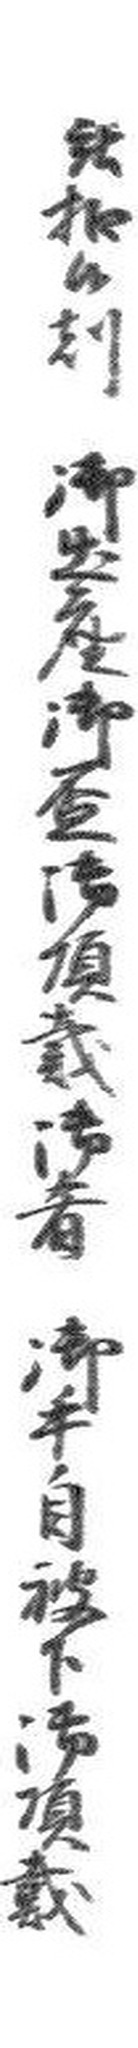被控候刻御出座御盃御頂戴御肴御手自被下御頂戴
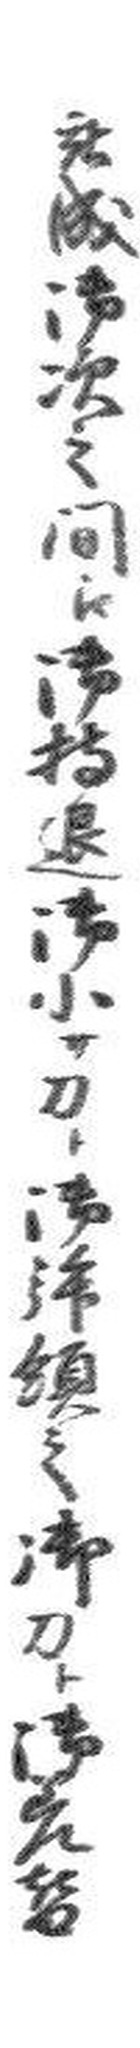被成御次之間江御持退御小サ刀ト御拝領之御刀ト御差替
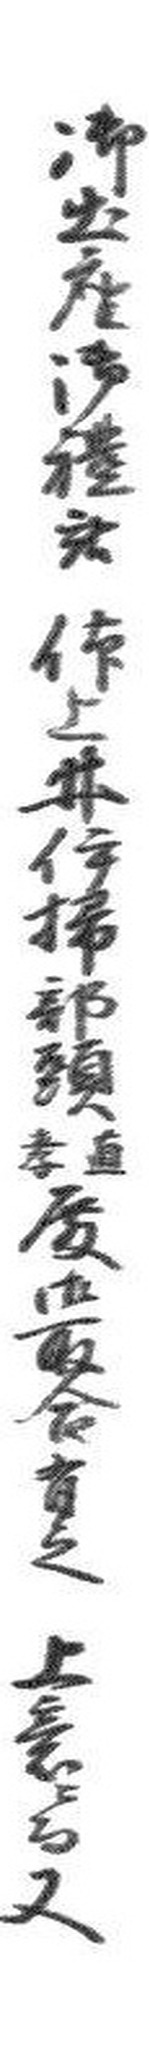御出座御礼被仰上井伊掃部頭直孝殿御取合有之上意ニ而又

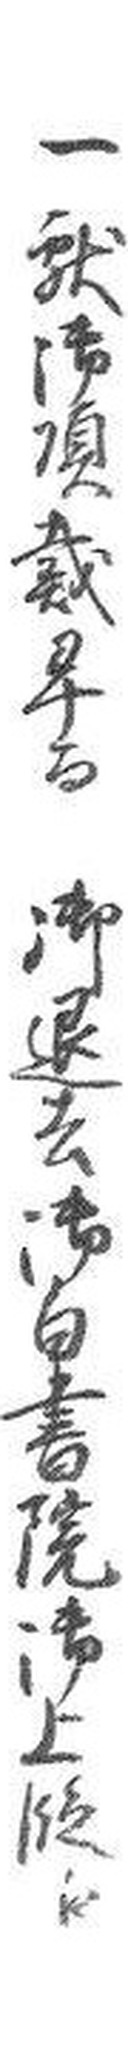一献御頂戴畢而御退去御白書院御上段江
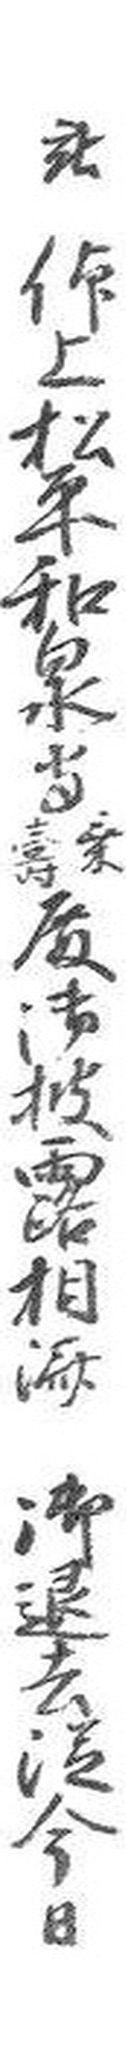被仰上松平和泉守乗寿殿御披露相済御退去従今日
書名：家譜 五 光通公 従寛永十三年到万治二年
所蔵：福井県文書館 Fukui Prefectural Archives
